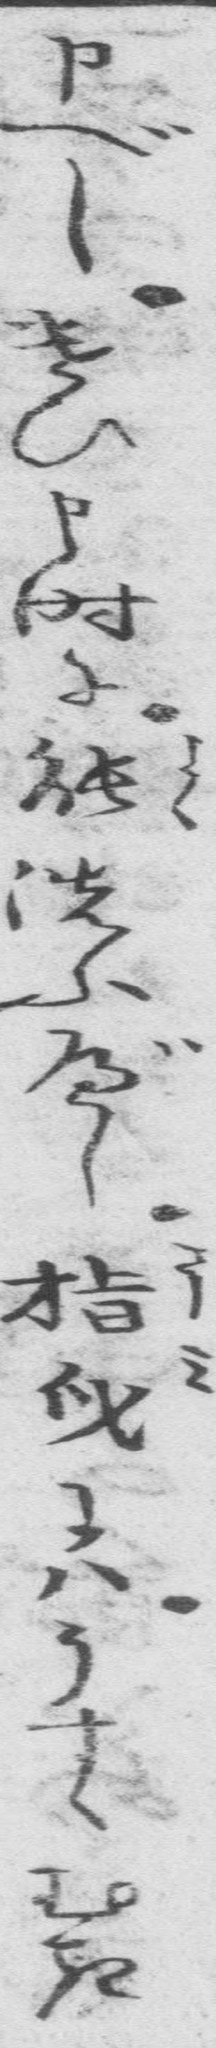申べし。遣ひ申時に。能洗ふべし。指身には。うすくむき
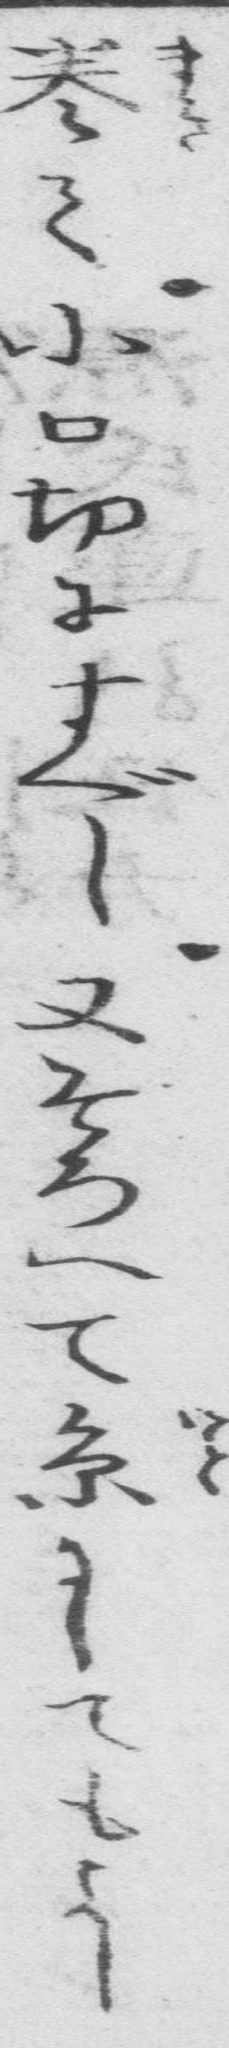巻て。小口切にすべし。又そろへて糸にしてもよし
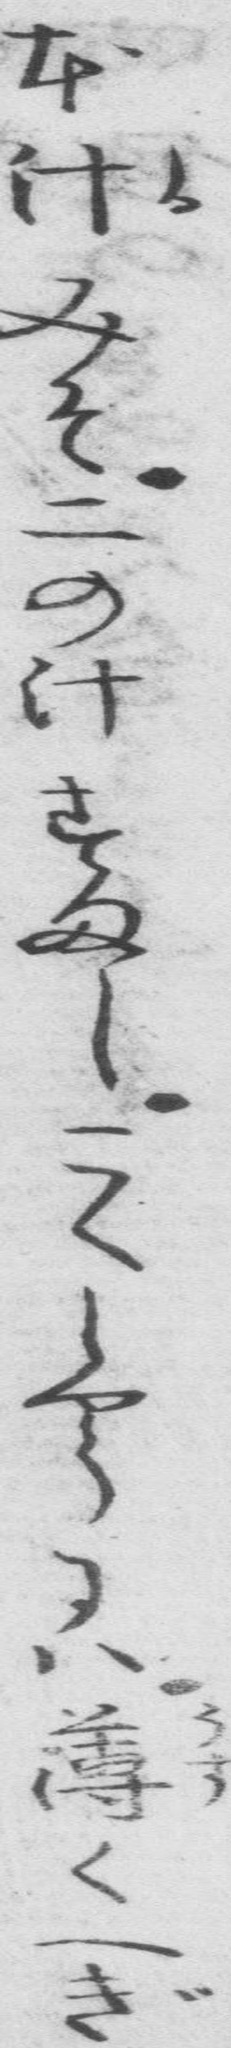本汁みそ。二の汁すまし。こくしやうには。薄くへぎ
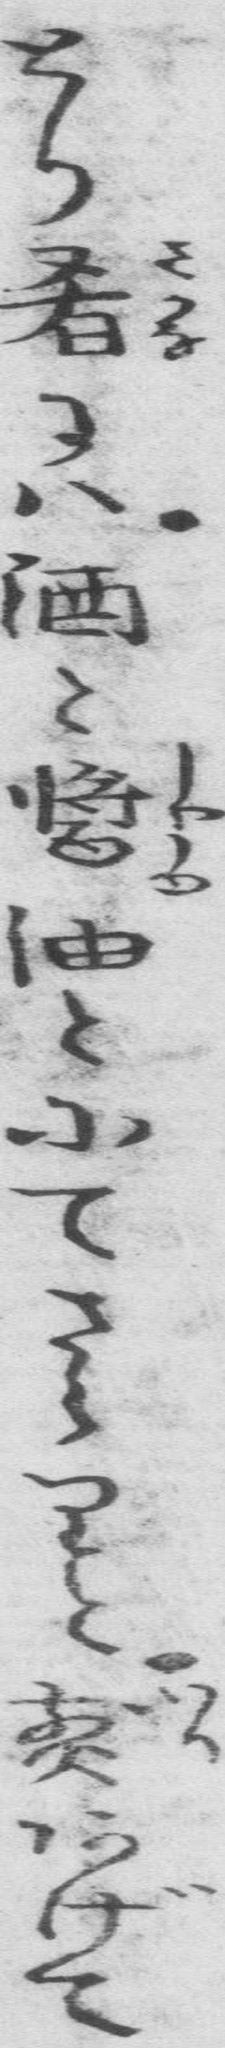とり肴には。酒と醤油とにてさらりと。煎あげて

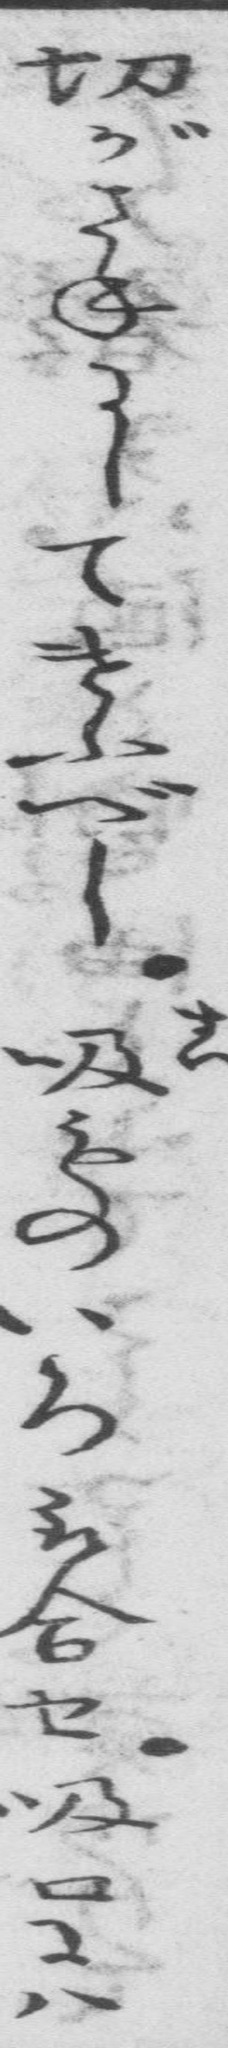切がさねにして遣ふべし。吸ものいろ取合せ。吸口には
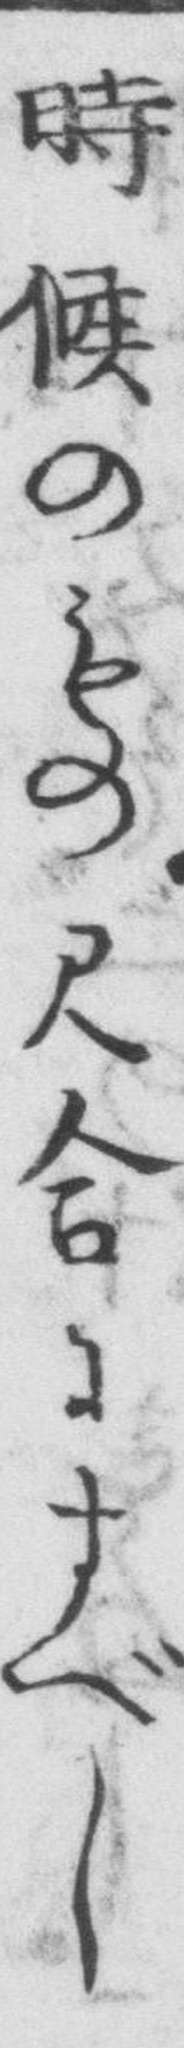時候のもの。見合にすべし
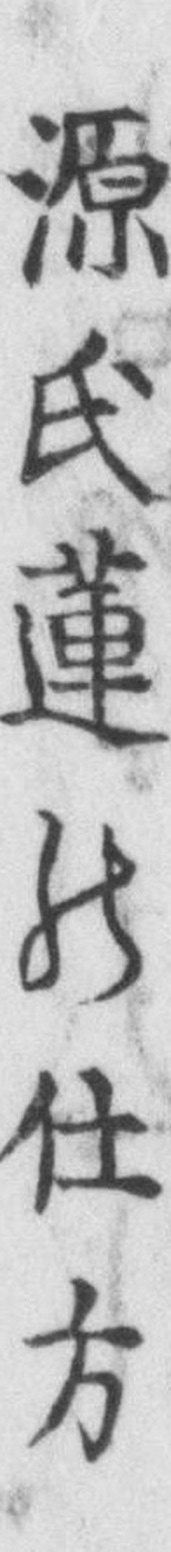源氏蓮の仕方
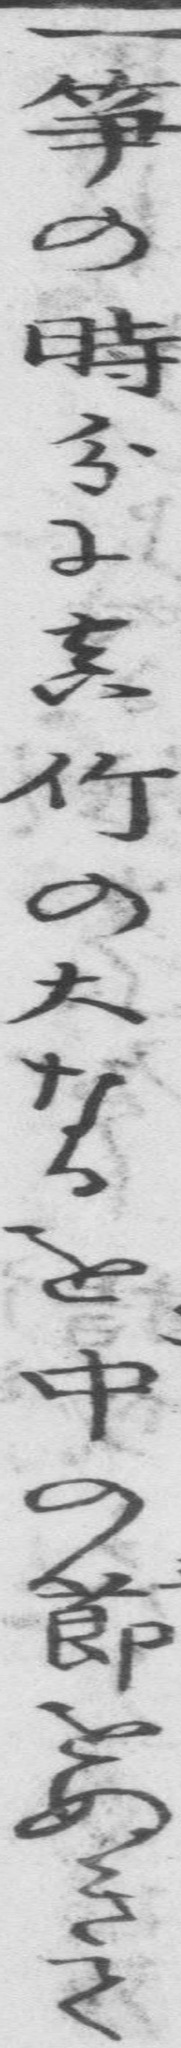一笋の時分に。真竹の大なるを。中の節をぬきて
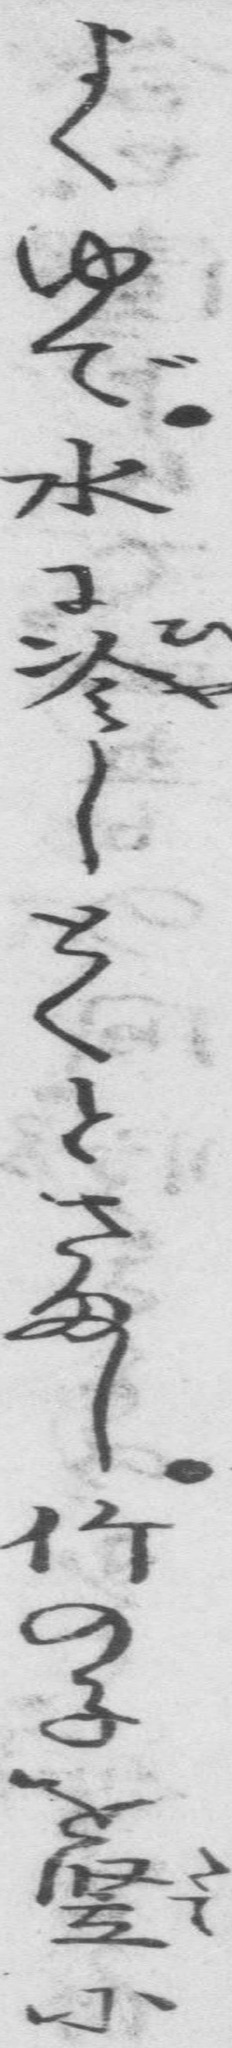よくゆで。水に冷しとくとさまし。竹の子を竪に
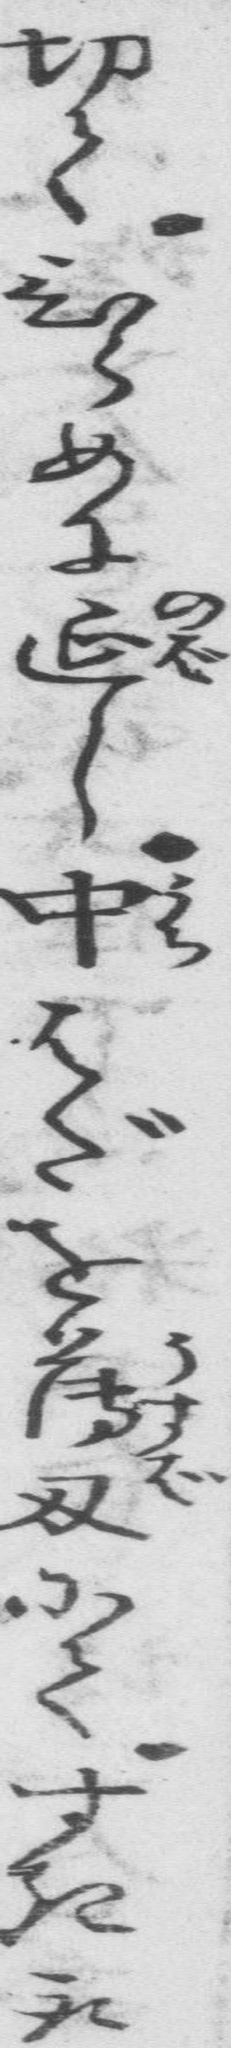切て。ひらめに延し。中はだを薄刃にて。すき取
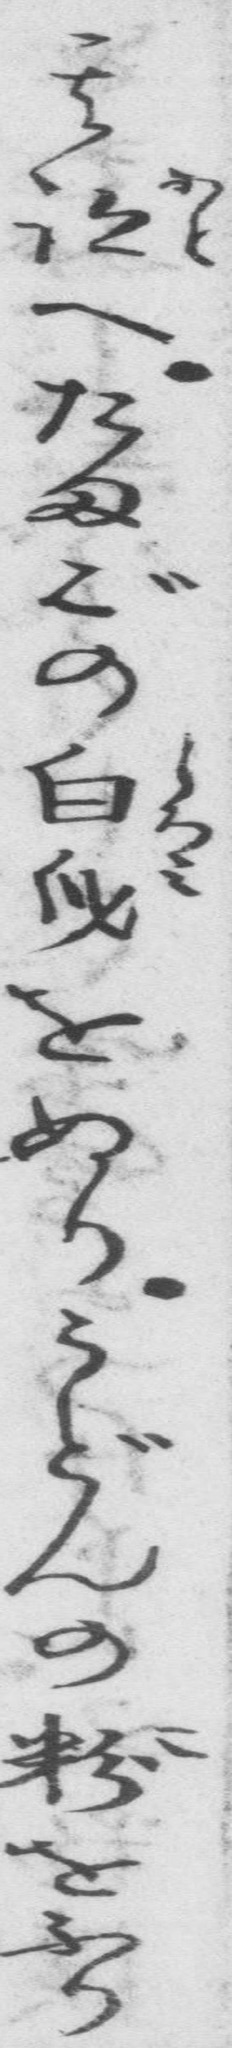其跡へ。たまごの白身をぬり。うどんの粉をふり
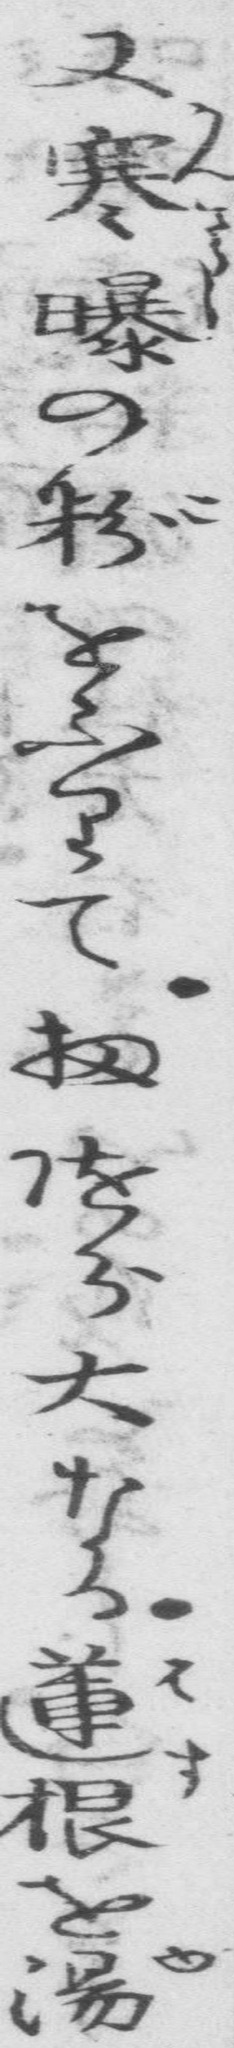又寒曝の粉をふりて。扨随分大なる。蓮根を湯
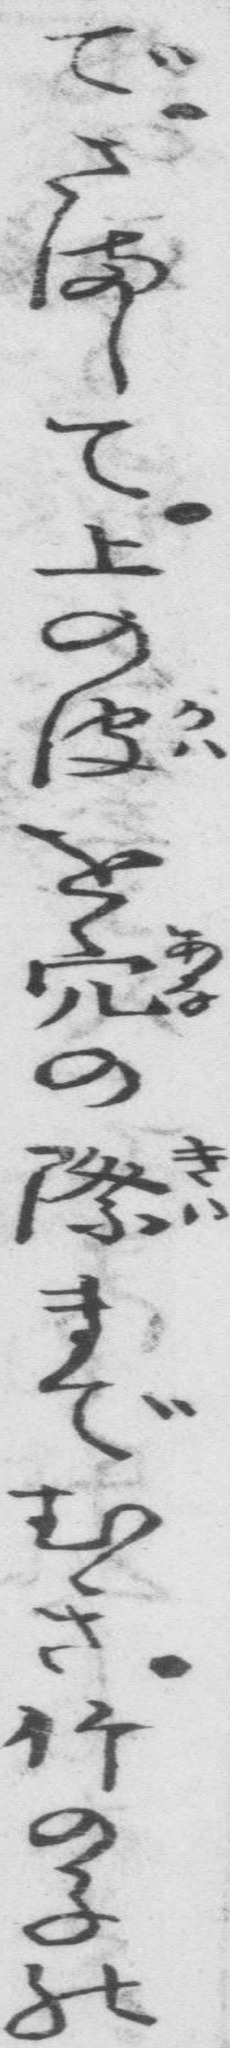で。さまして。上の皮を穴の際までむき。竹の子の
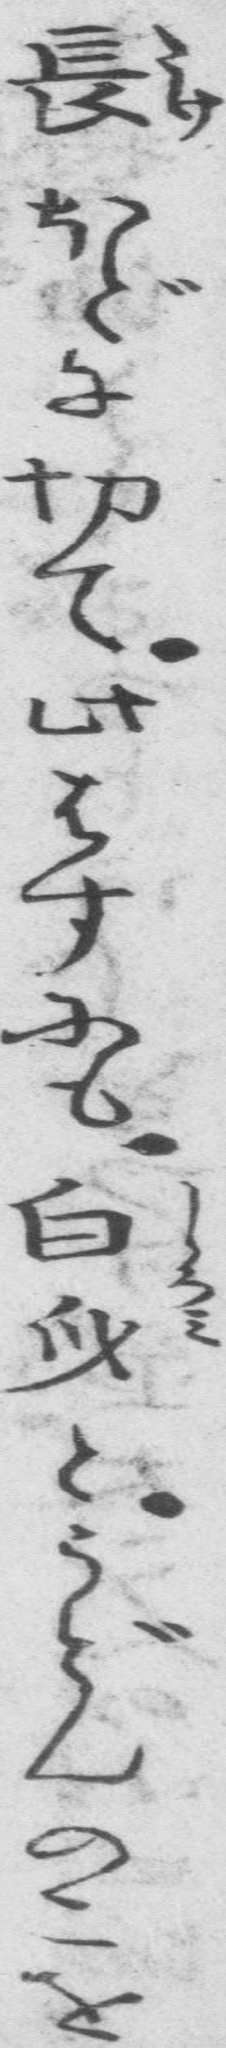長ほどに切て。此はすにも。白身と。うどんのこを
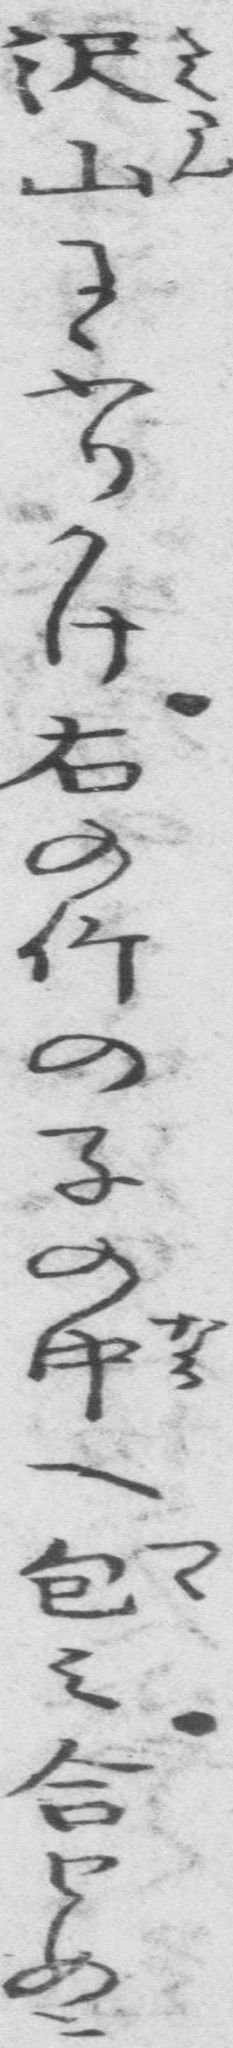沢山にふりかけ。右の竹の子の中へ包み。合せめに
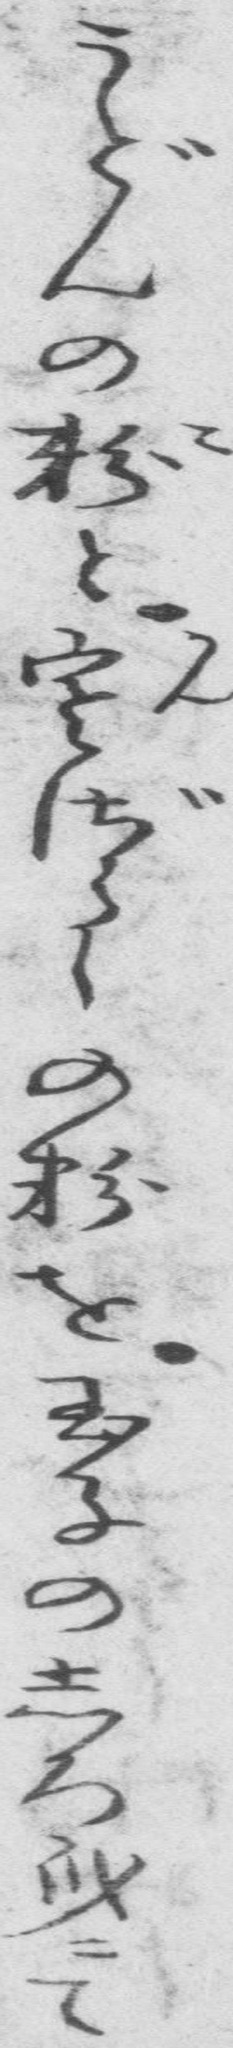うどんの粉と。寒ざらしの粉を。玉子のしろ身にて
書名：萬寳料理秘密箱
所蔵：大阪府立大学学術情報センター 国文学研究資料館
